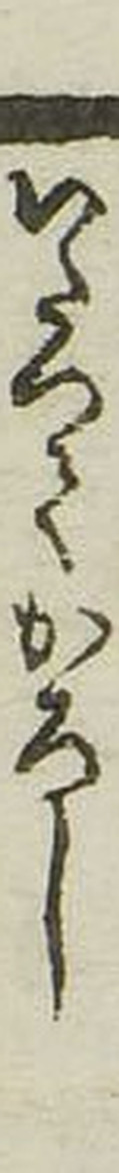いたつてかろし

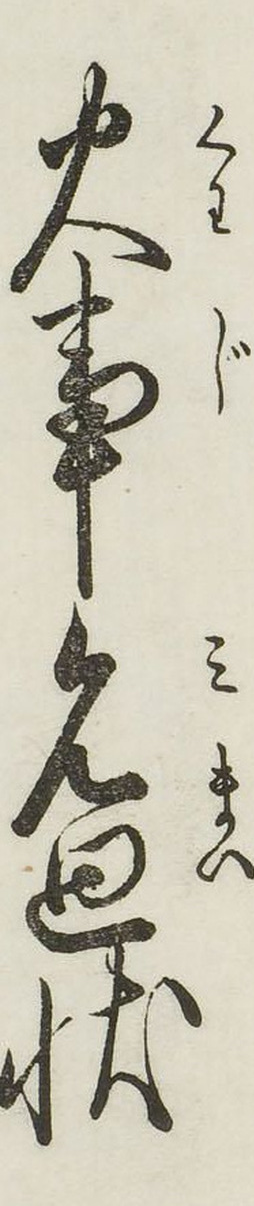火事見廻状

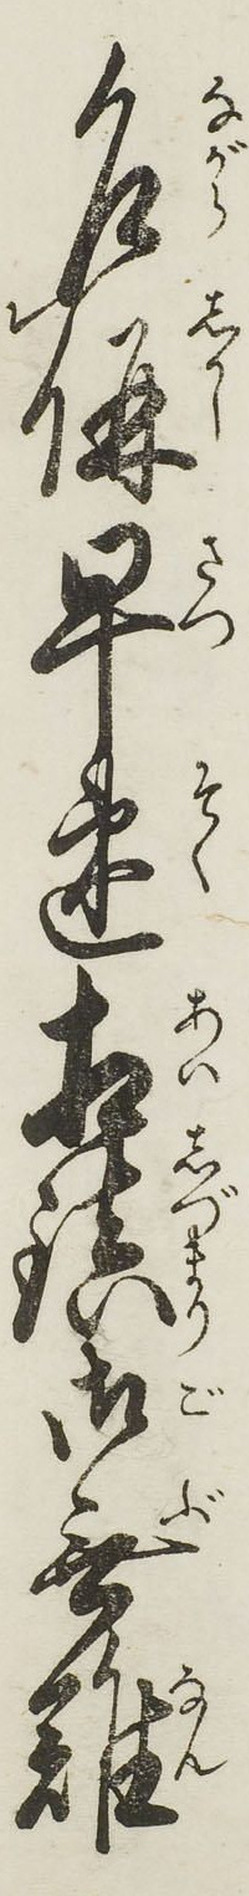乍併早速相鎮御無難
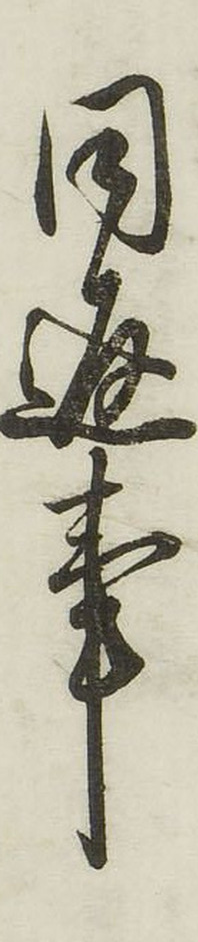同返事

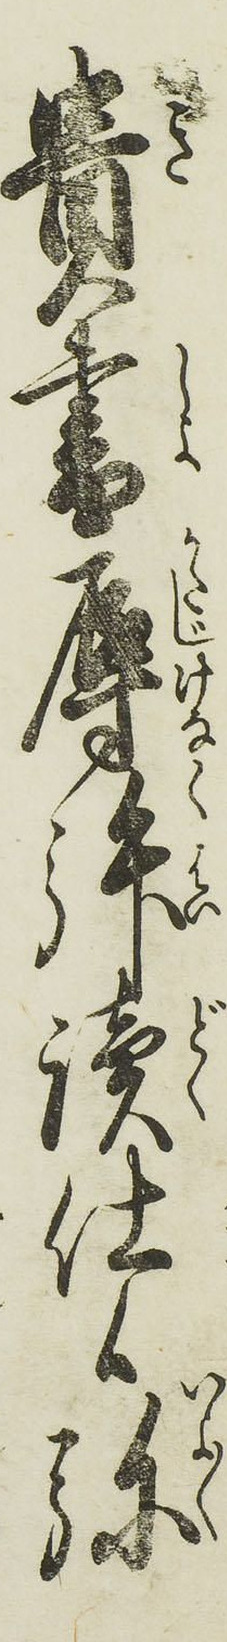貴書辱拝読仕候弥
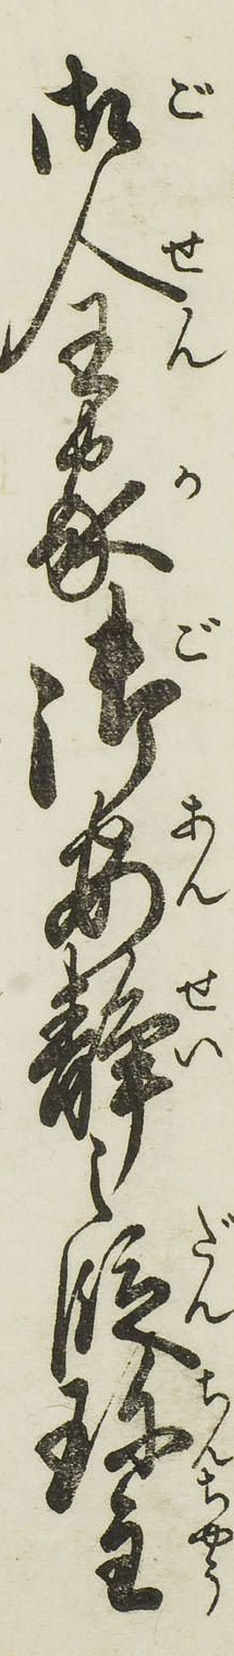御全家御安静之段珍重

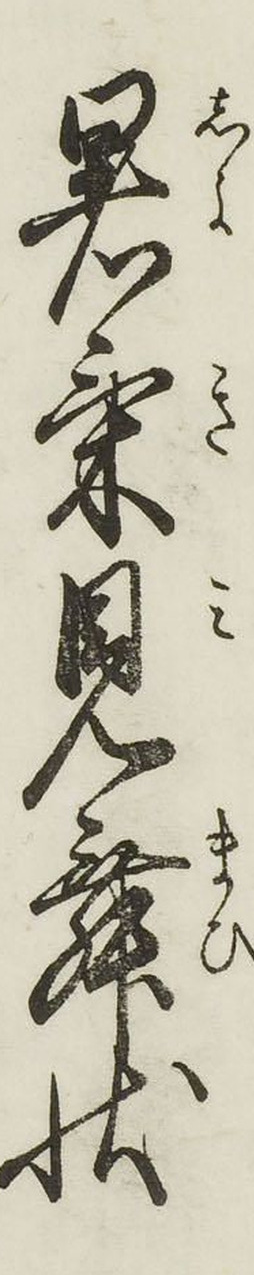暑気見舞状
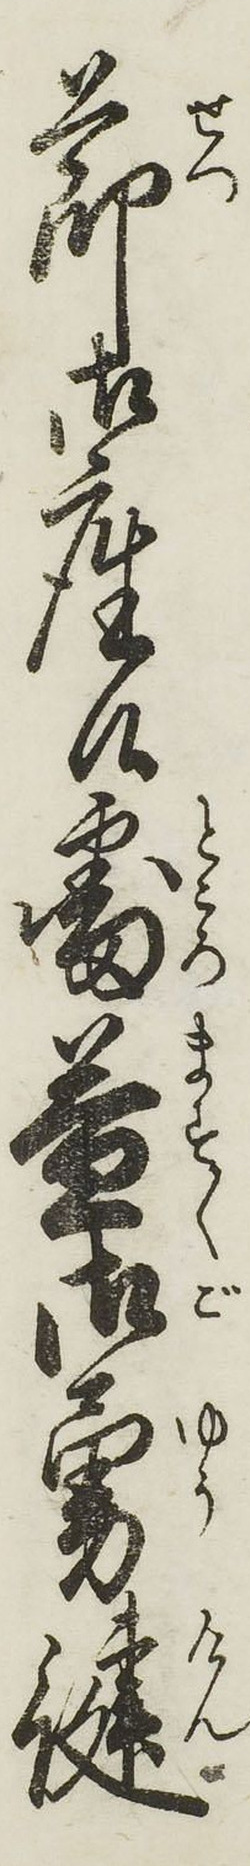節御座候処益御勇健

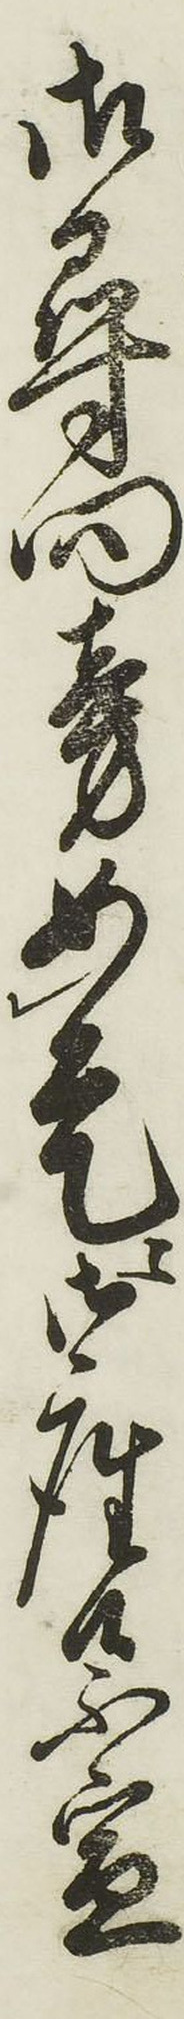御尋問旁如是御座候不宣
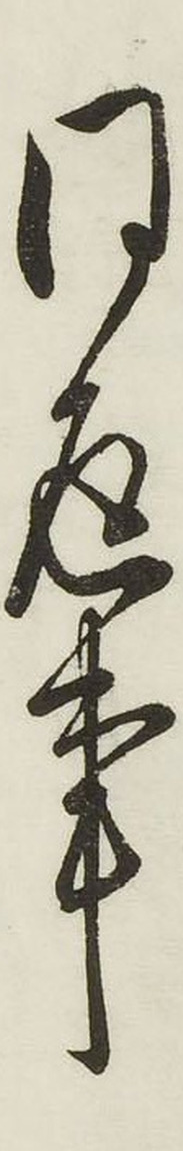同返事
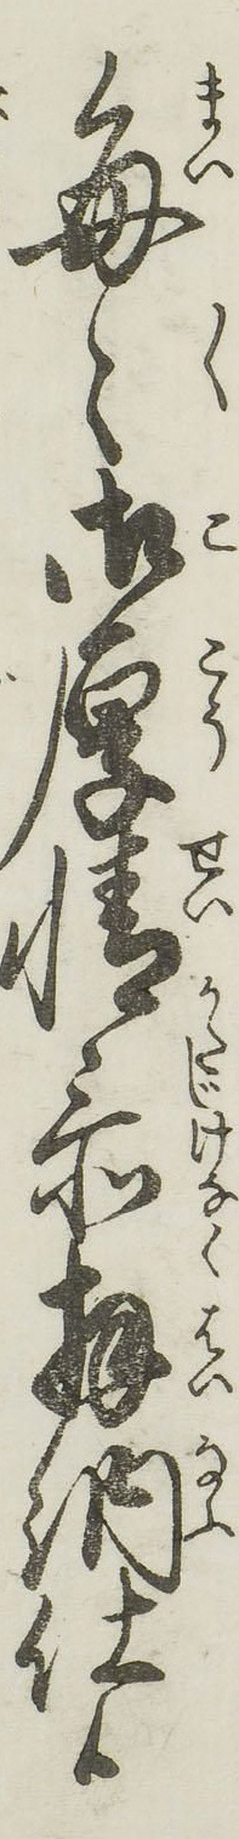毎々御厚情忝拝納仕候

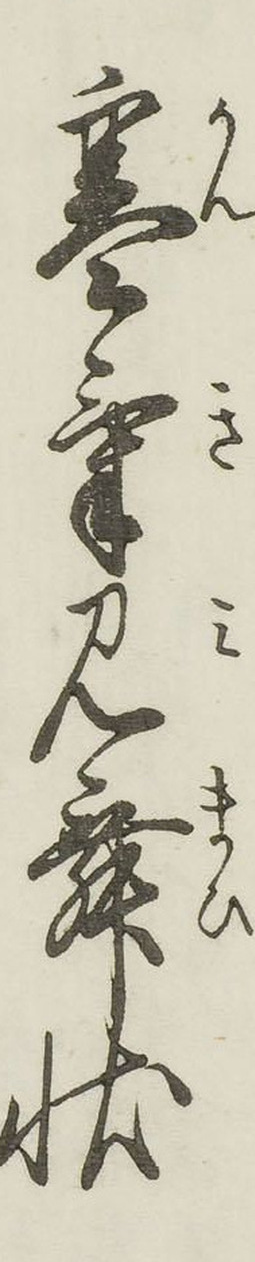寒気見舞状
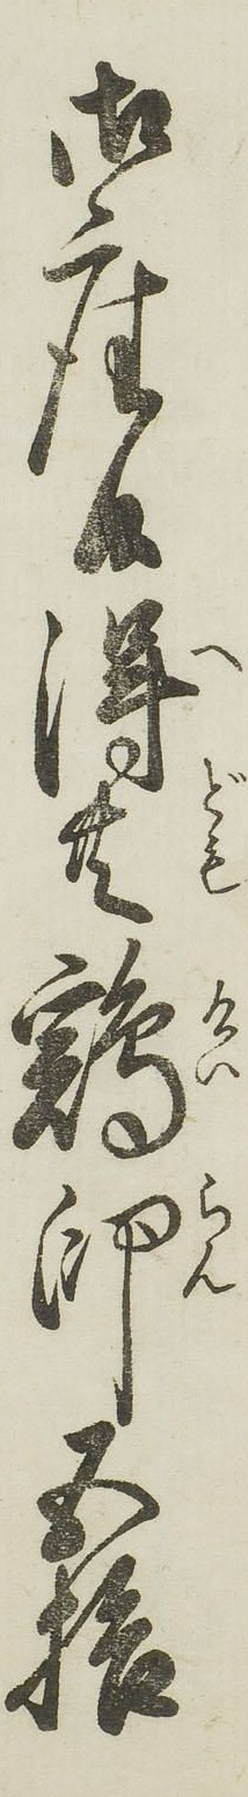御座候得共鶏卵五拾

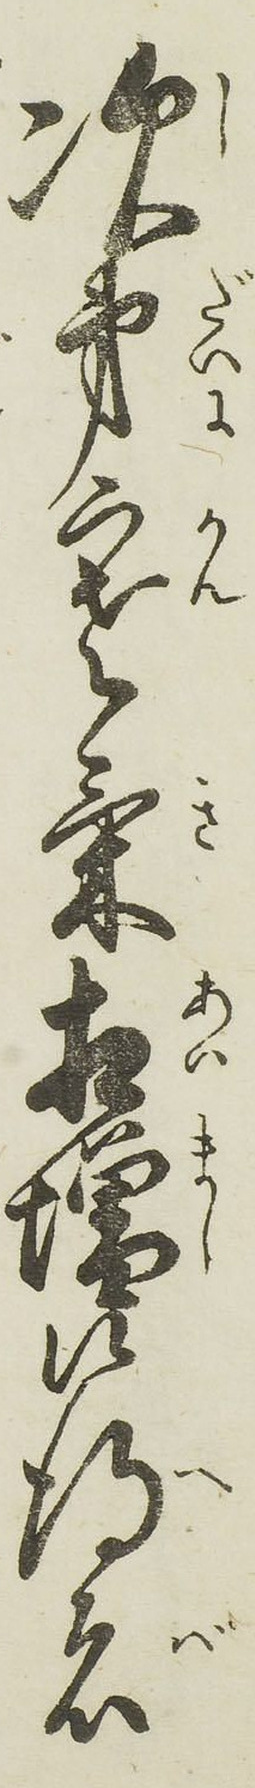次第寒気相増候得者
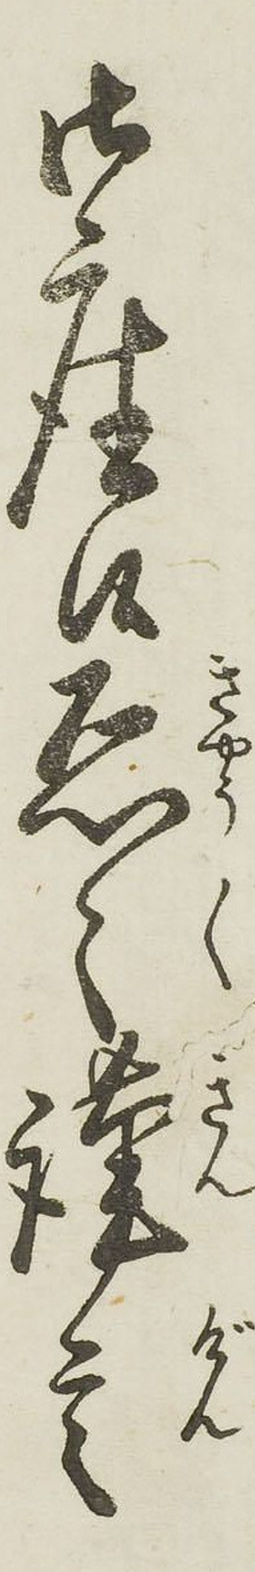御座候恐々謹言
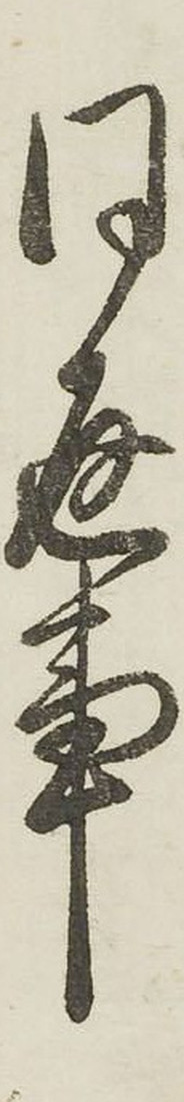同返事
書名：商人書翰便覧
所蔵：東京学芸大学教育コンテンツアーカイブ
